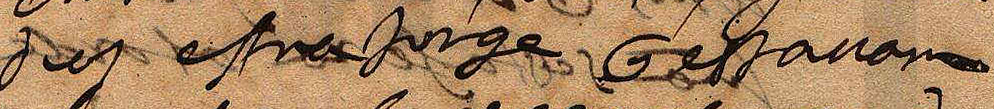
dias e Ana Jorge q̄ estauam
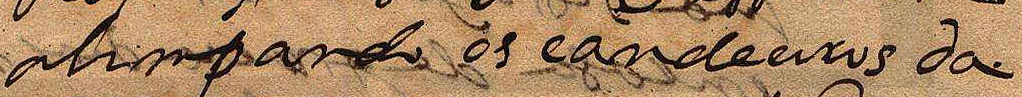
alimpando os candeeiros da
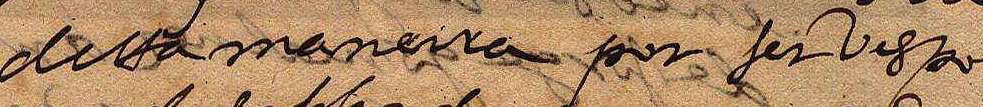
ditta maneira por ser vespo
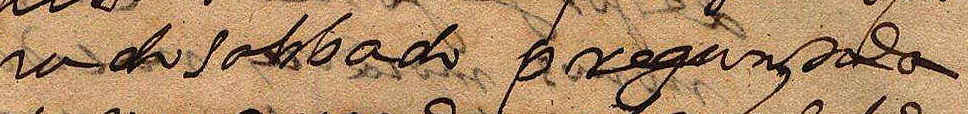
ra do sabbado preguntada
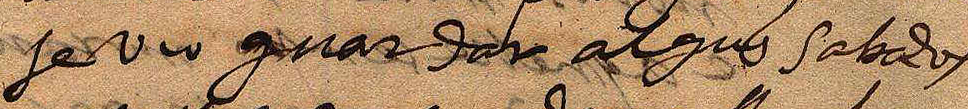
se vio guardar algūs sabados
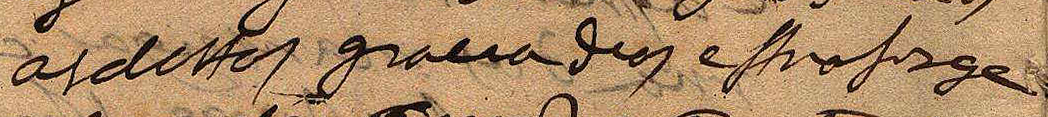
as dittas gracia diaz e Ana Jorge
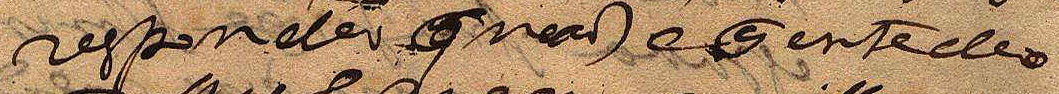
respondeo q̄ naõ e q̄ entēdeo
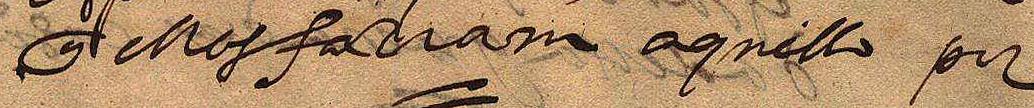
q̄ ellas faziam aquillo por
